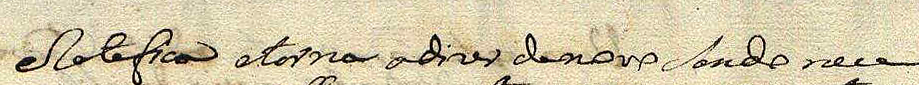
Ratefica e torna a dizer de novo Sendo nece
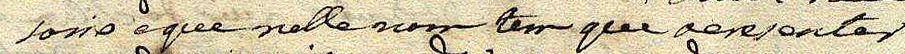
sario e que nelle nam tem que acresentar
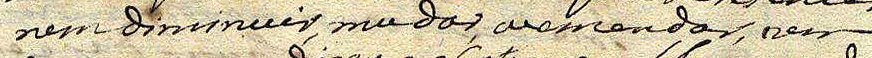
nem diminuir, mudar, ou emendar, nem
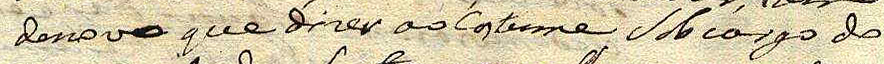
de novo que dizer ao costume sob cargo do
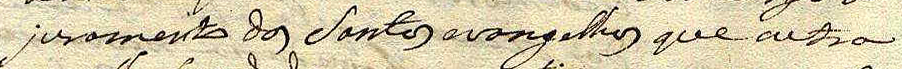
juramento dos Santos evangelhos que outra
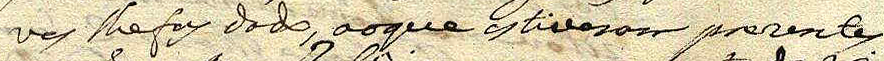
ves lhe foy dado, ao que estiveram prezentes
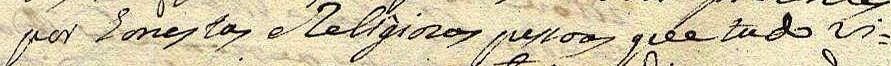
por honestas e Religiozas pessoas que tudo vi
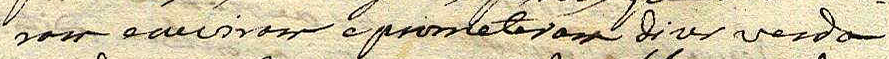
ram e ouviram e prometeram dizer verda
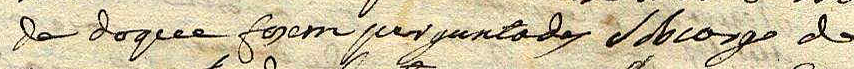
de do que fosem perguntadas sob cargo do
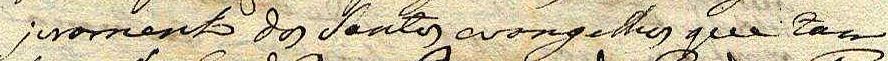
juramento dos Santos evangelhos que tam
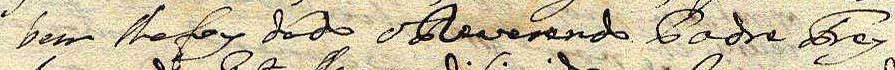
bem lhe foy dado o Reverendo Padre Frey
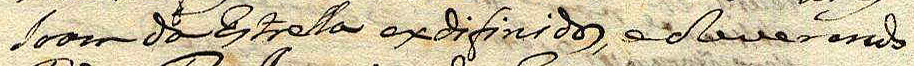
Ioam da Estrella ex difinidos, e Reverendo
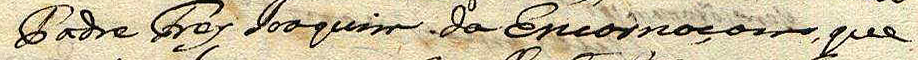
Padre Frey Ioaquim da Encarnaçam, que
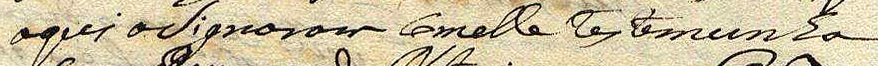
aqui asignaram com elle testemunha
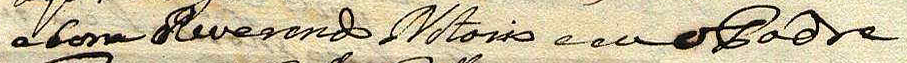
e Com Reverendo Notario e eu o Padre
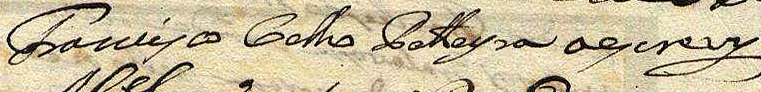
Francisco Coelho Petteyra o escrevy
